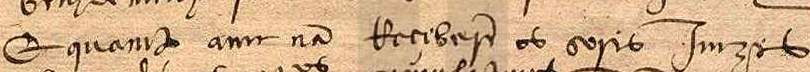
E quamto a me nā Receberē os sores Juizes
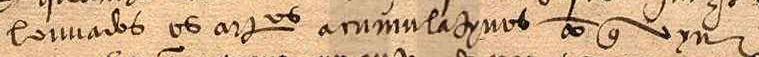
louuados os artos acumulatyuos c̄o q̄ vym
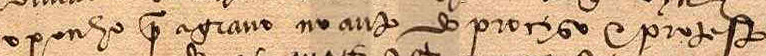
oponho p̄o agrauo no auto do proceso e protesto
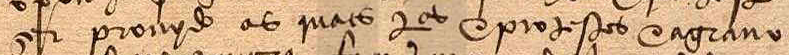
ser prouydo as quaes tas e protestos e agrauo
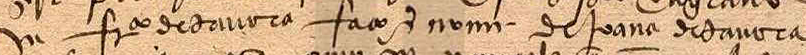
eu frco de tauora faço ē nome de Joana de tauora
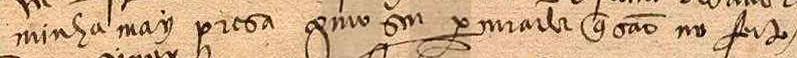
minha may presa como seu ꝓcurador q̄ são no feito /
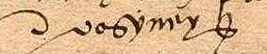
e o asyney
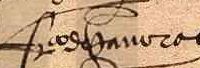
frco de tauora
